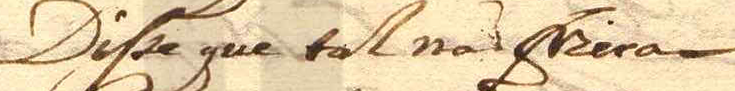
Disse que tal nã fizera
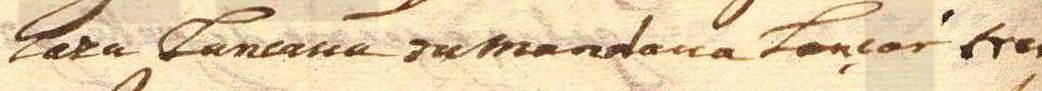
caza Lancaua ou mandaua Lançar tres
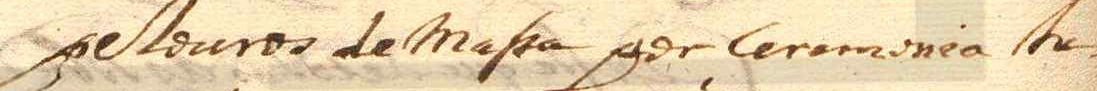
pelouros de Massa por Çeremonia Iu
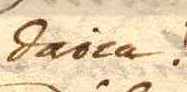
daica?
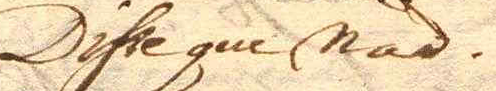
Disse que naõ.
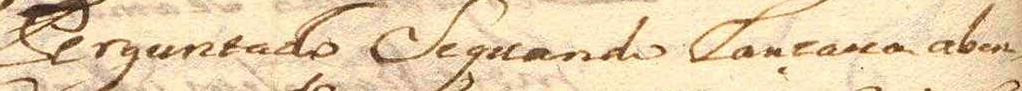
Perguntado Se quando Lançaua a ben
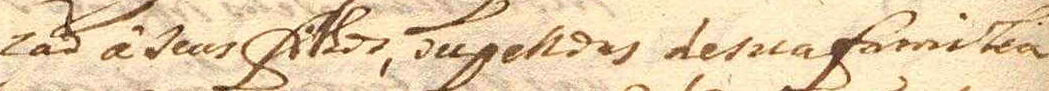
çaõ á seus filhos, ou pessoas de sua familia
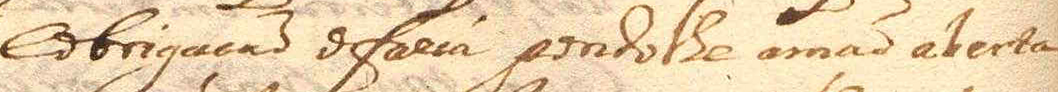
E obrigaçaõ o fazia pondolhe a maõ aberta
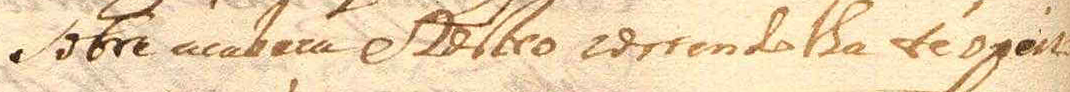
sobre a cabeça e rostro correndolha té o peito
